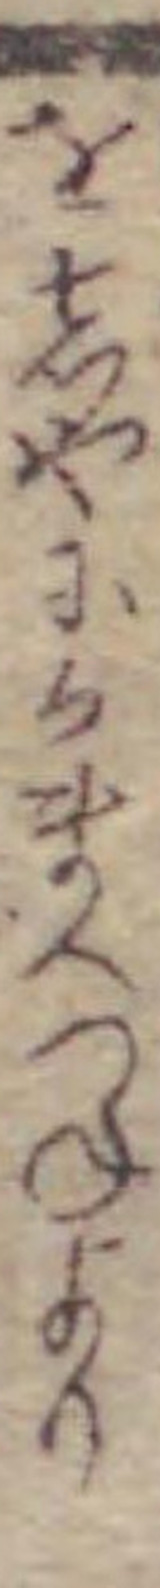をしやにかまへつねより
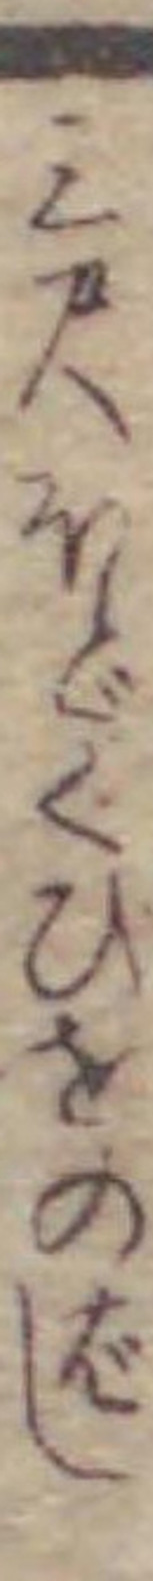三尺ほどくびをのばし
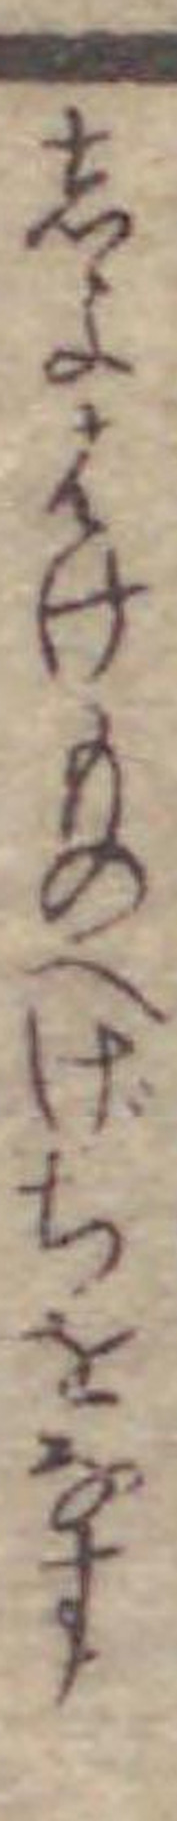しよはけものへげちをなす
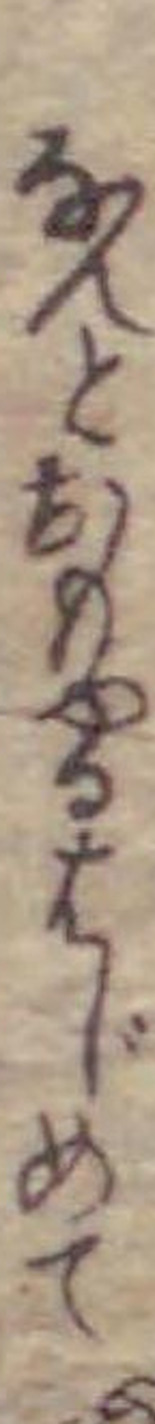なんとおもやるはじめて
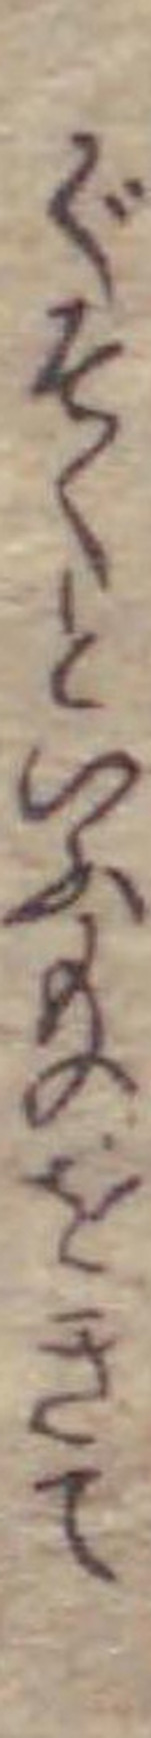ぐそくといふものをきて
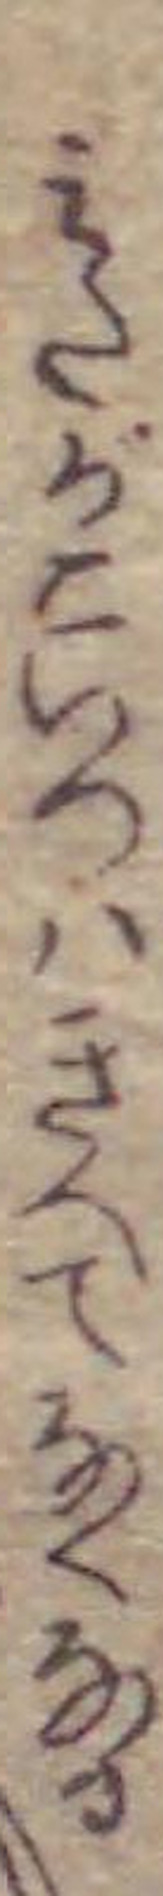みたがこいつはきへてなくなる

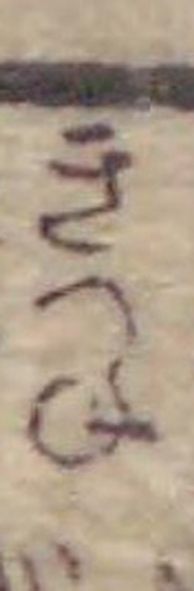きつね
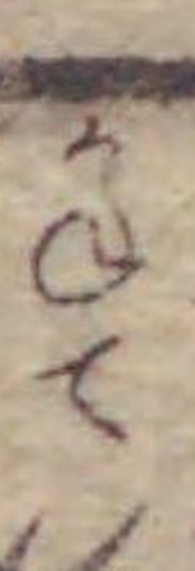かねて
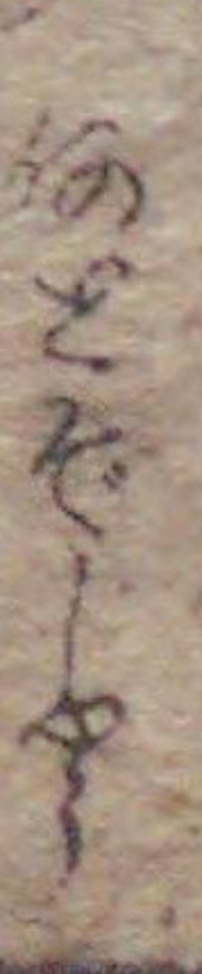何とぞしやう
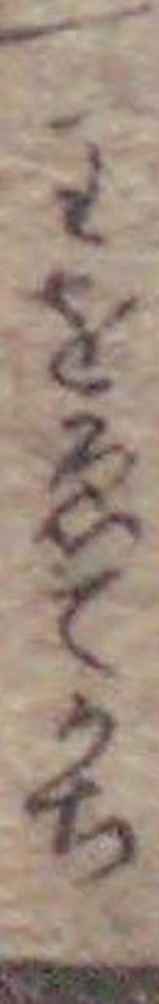りをゑてかち
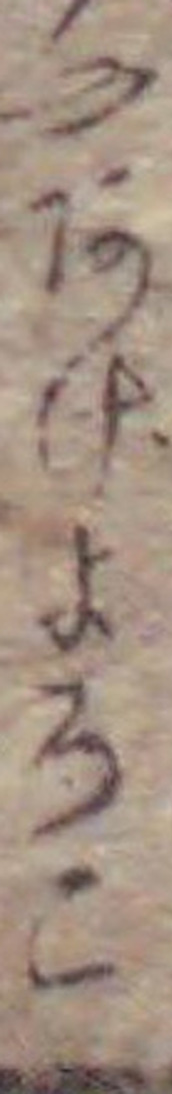あけよろこ
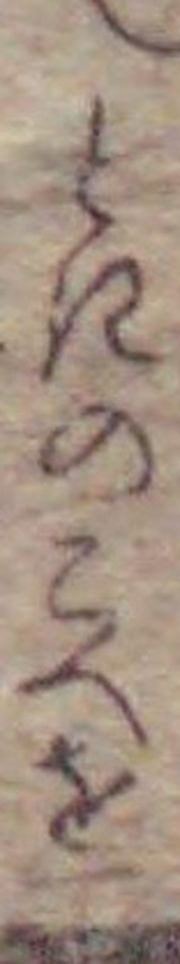ときのこへを
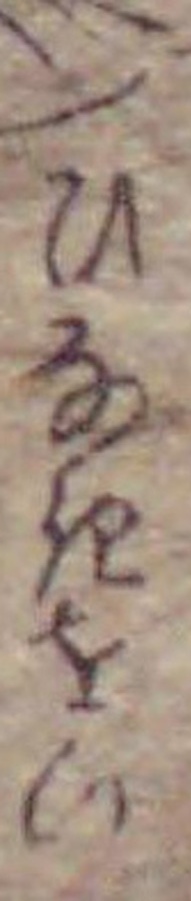ひなきをい
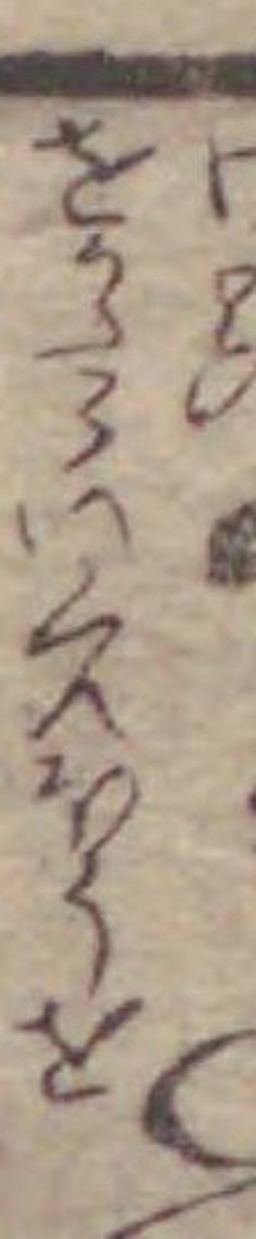をかたらいくんほうを
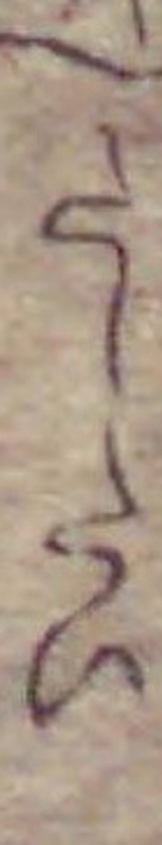たしたい
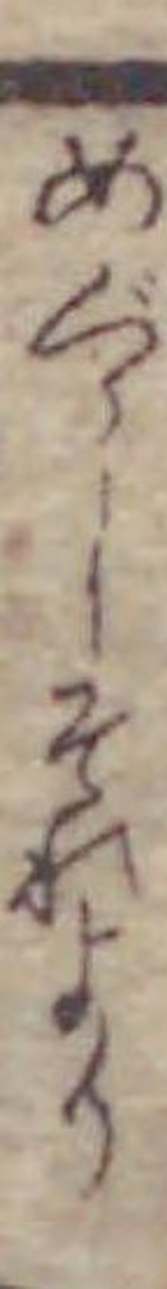めぐらしそれより
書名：化物仲間破 : 2巻
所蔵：国立国会図書館 National Diet Library, JAPAN
